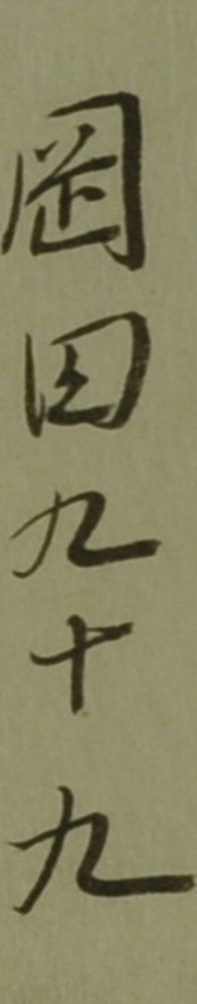岡田九十九
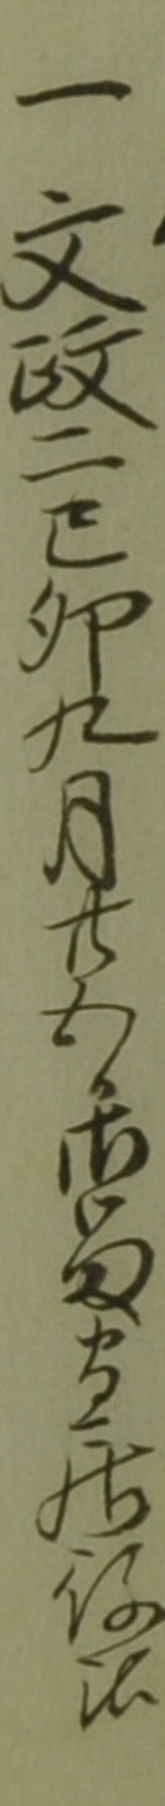一文政二己卯九月廿五日御留守居役被
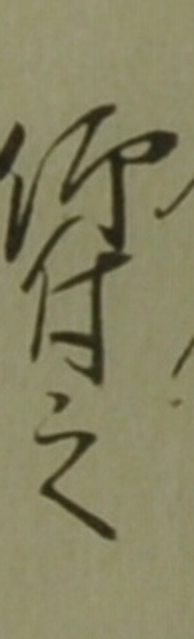仰付之
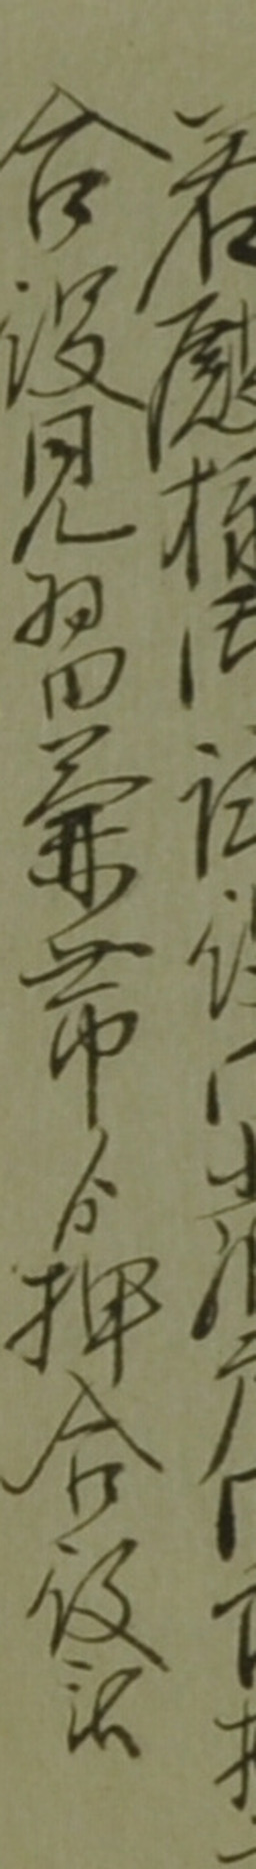合役見習兼帯ゟ押合役被
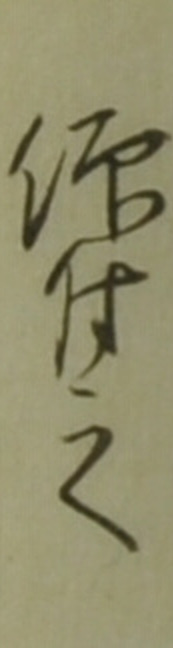仰付之

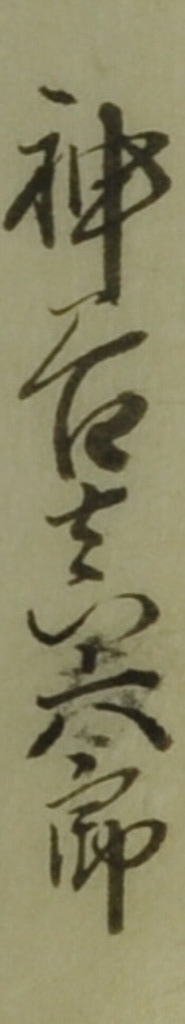神谷真六郎
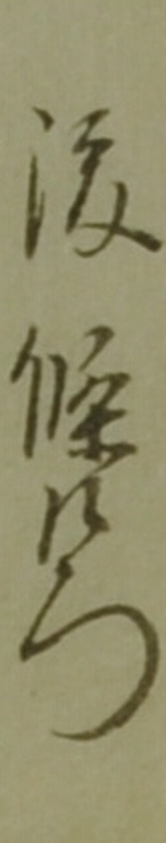後條左衛門
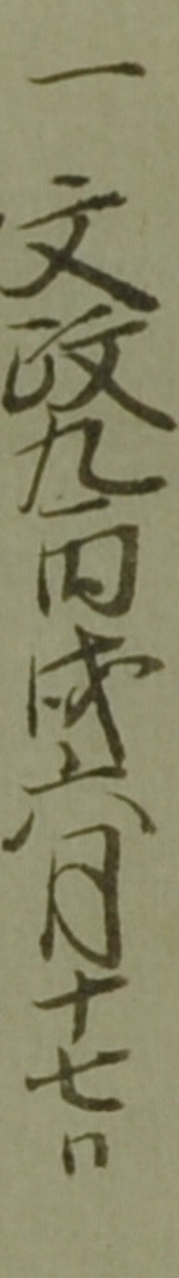一文政九丙戌六月十七日
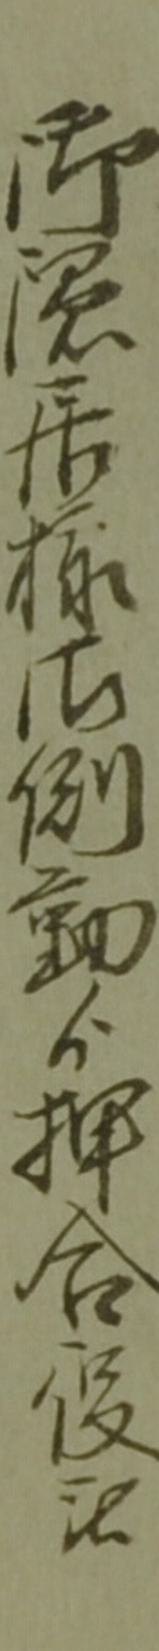御隠居様御側勤ゟ押合役被
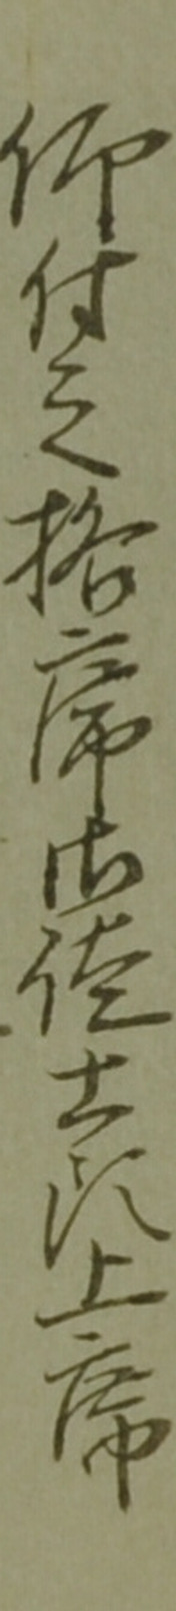仰付之格席御徒士頭上席
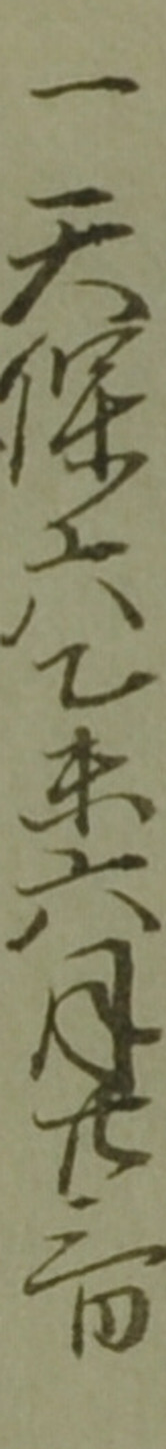一天保六乙未六月廿三日
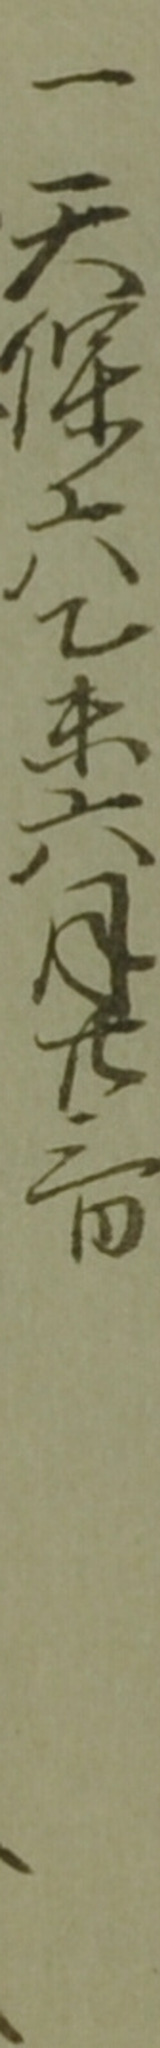一天保六乙未六月廿三日
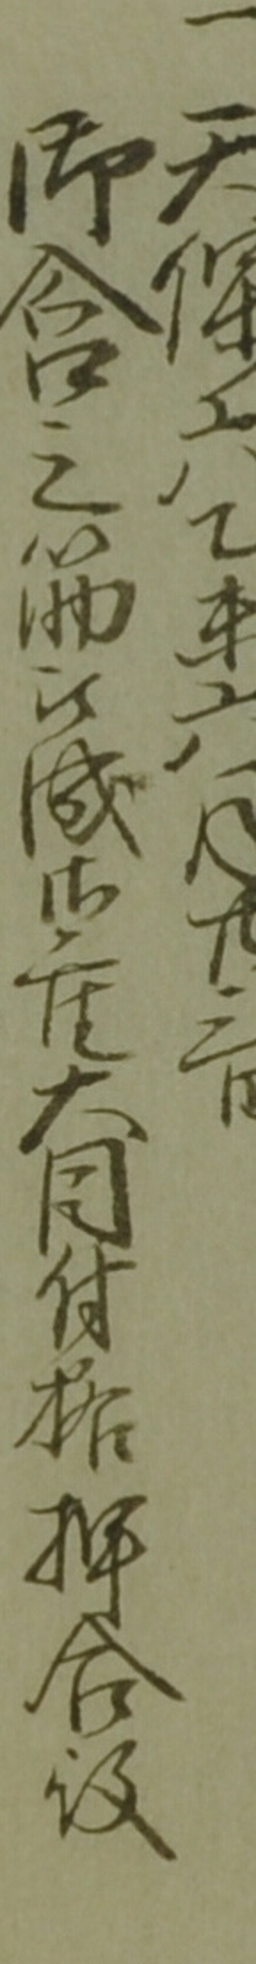御含之筋被成御座大目付格押合役
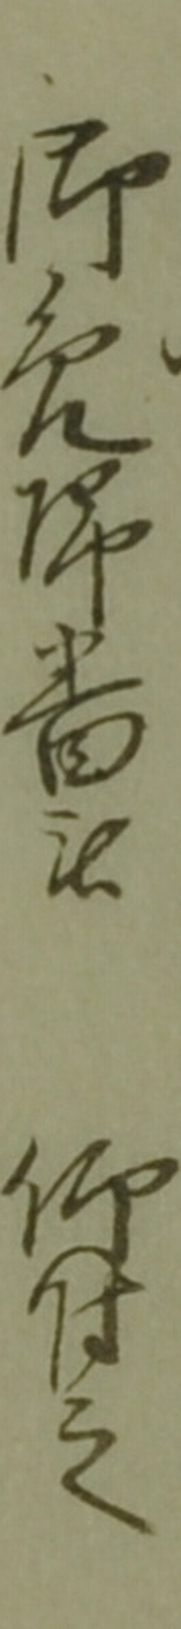御免帰番被仰付之
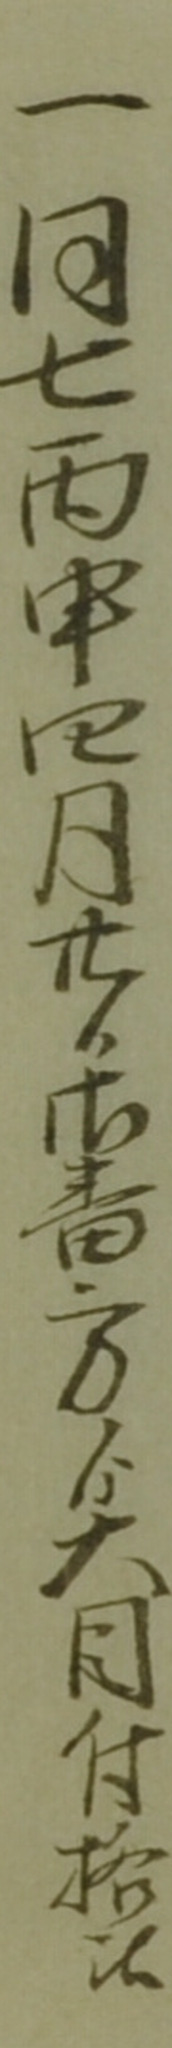一同七丙申四月廿日御番方ゟ大目付格被
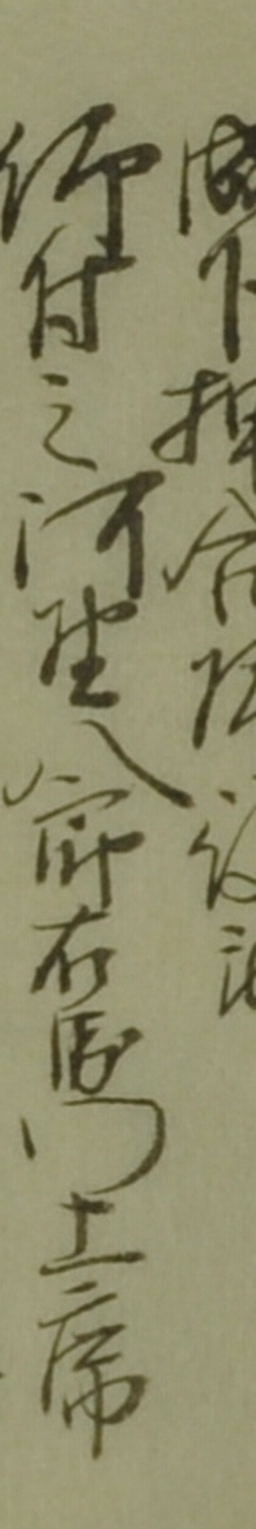仰付之河野八郎右衛門上席
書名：諸御役代々録（七）
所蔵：伊那市立高遠町図書館・合同会社AMANE
